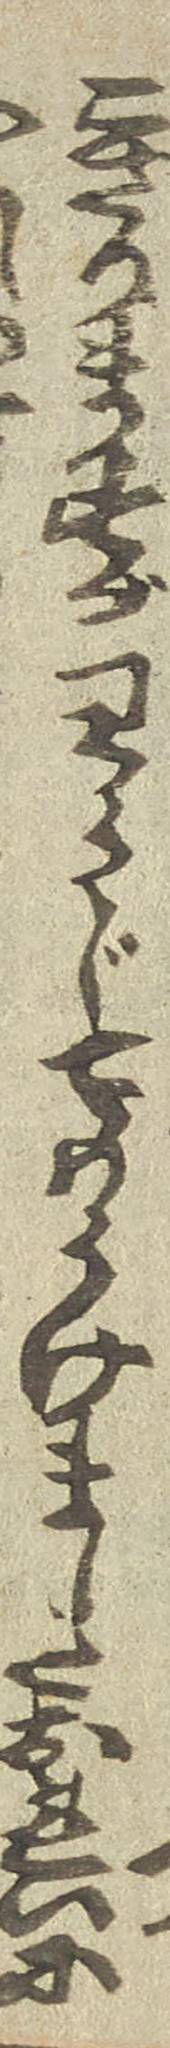こざりますがわらじでもうけましたおれいに
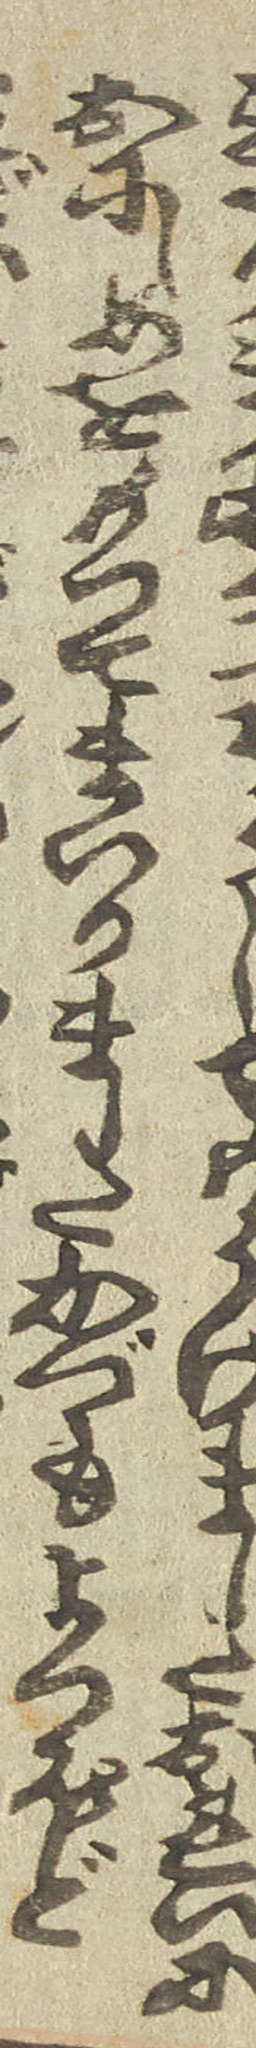おにしめをもつてまいりましたかづもよつぽど
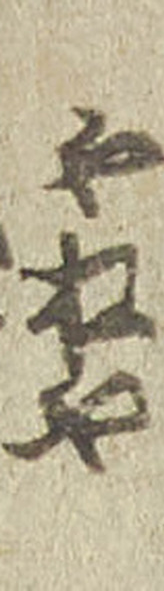やねや
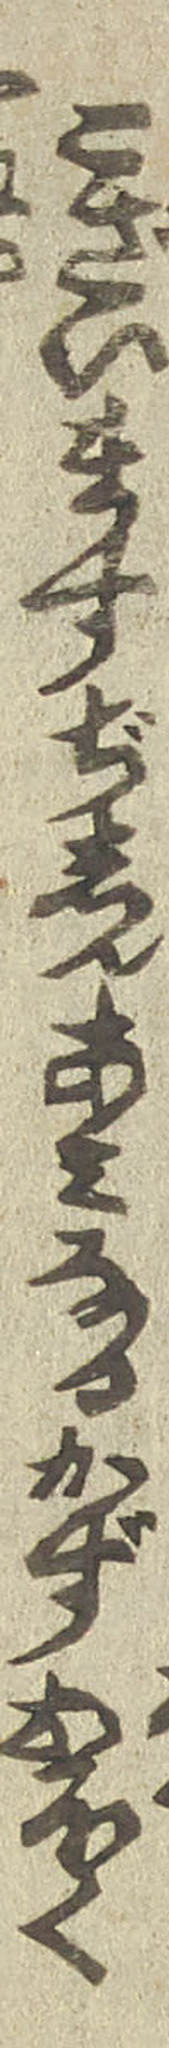こざいますぢしんあきなるかずおほく
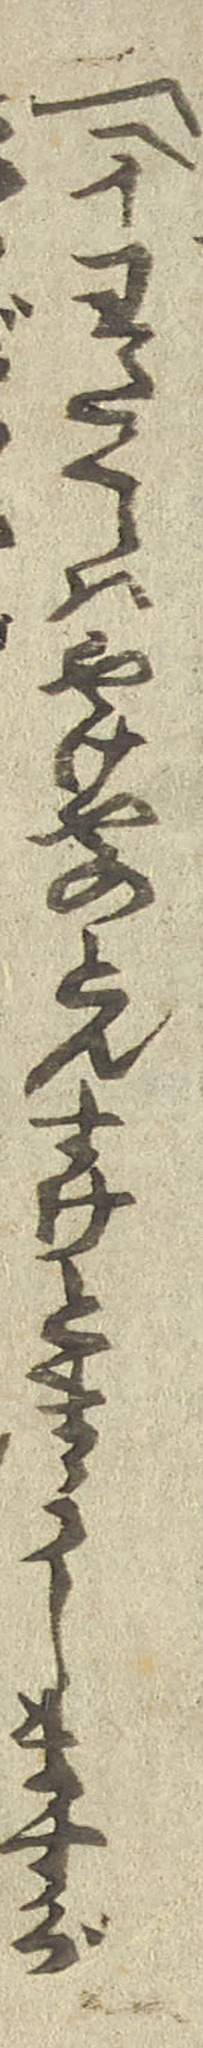「ヘイわたくしはやけやのとんすけとまうしますが
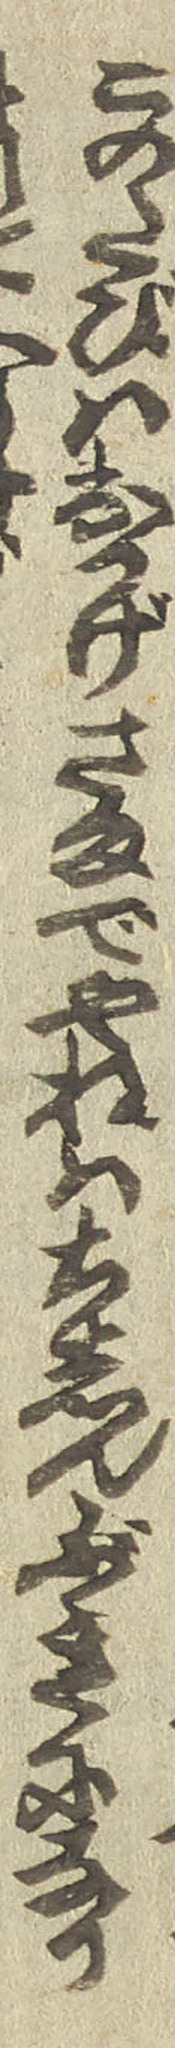このたびはおかげさまでやねはちしんぶきになり
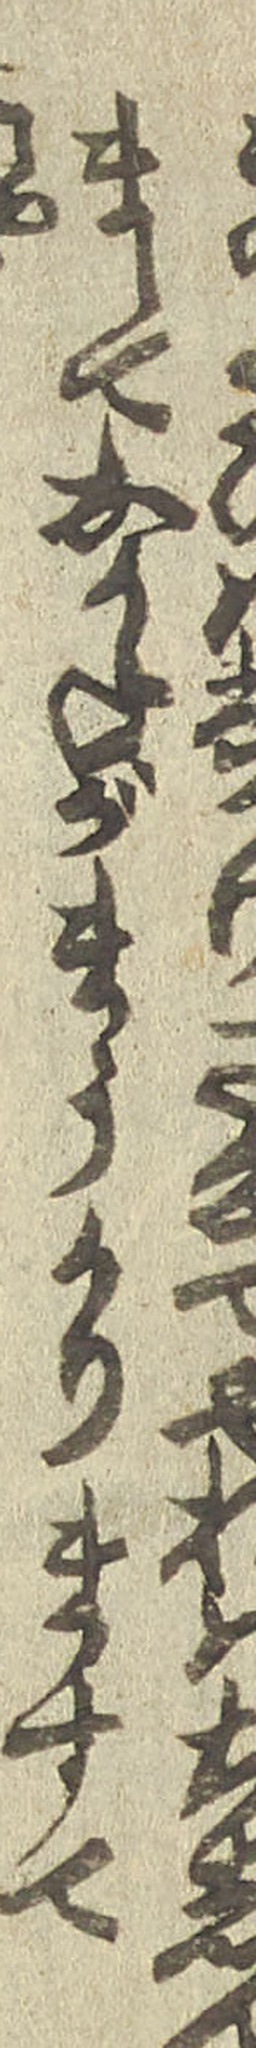ましておかねがまうかりますて
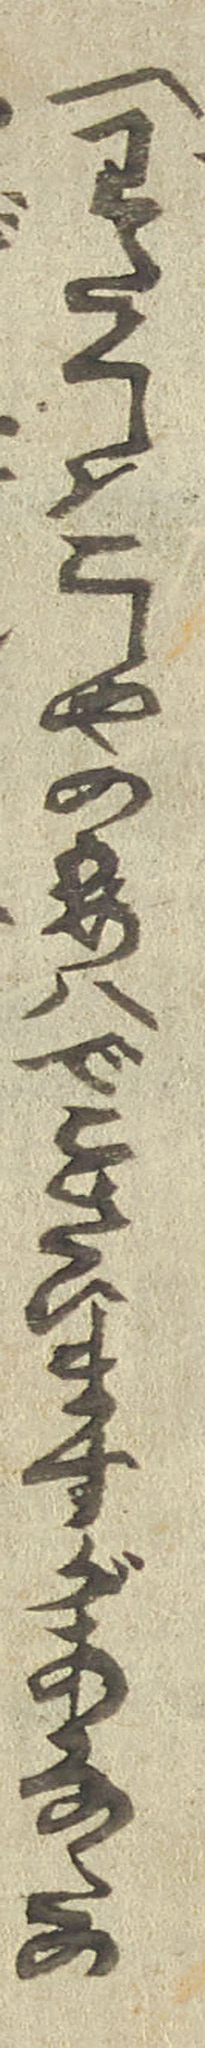「わたくしはこしやのうめ八でこさいますがあなたの
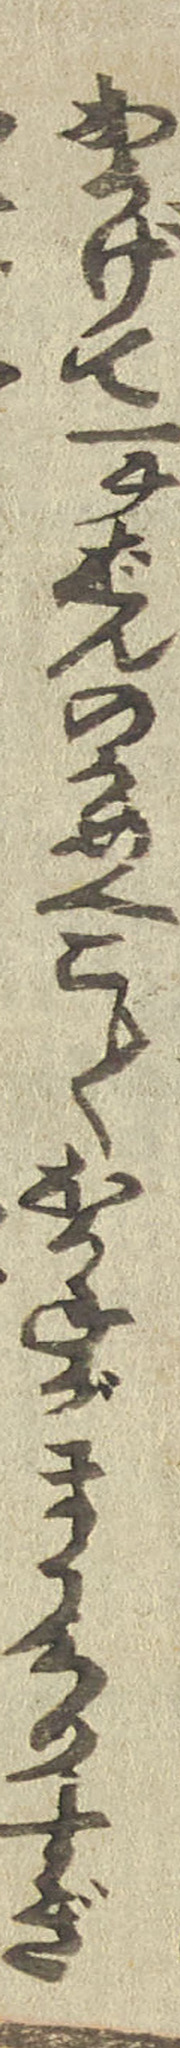おかげて一チばんのうめへこし〳〵おかねがまうかりすぎ
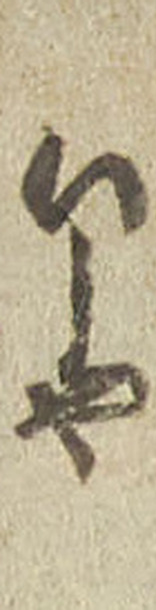いしや
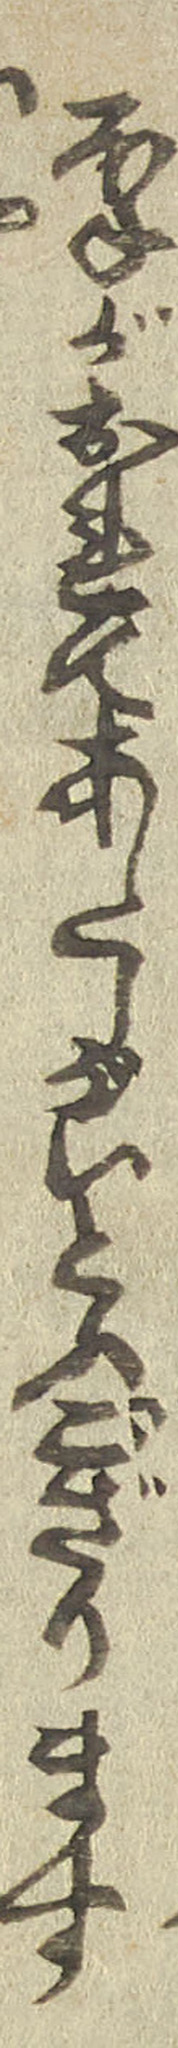ほねがおれてあしこしがいとふござります
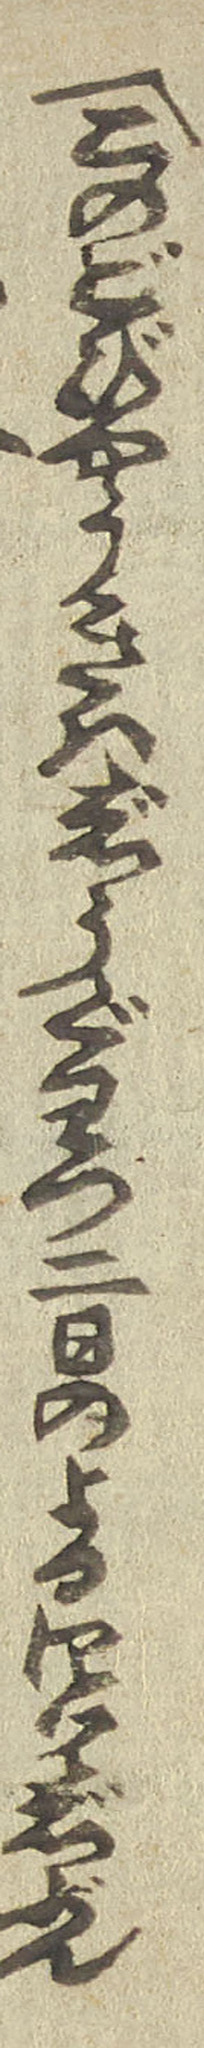「このごびやうきはじうぐわつ二日のよる四つじぶん
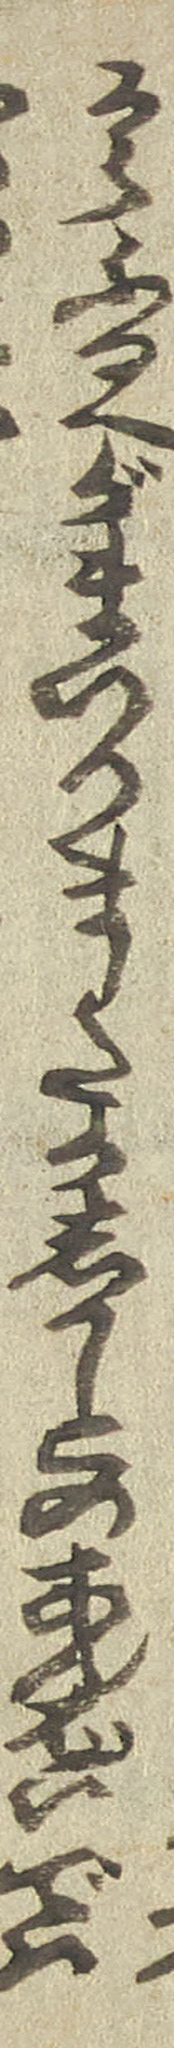からふるへがまいりましたかしかしこのあんばいでは
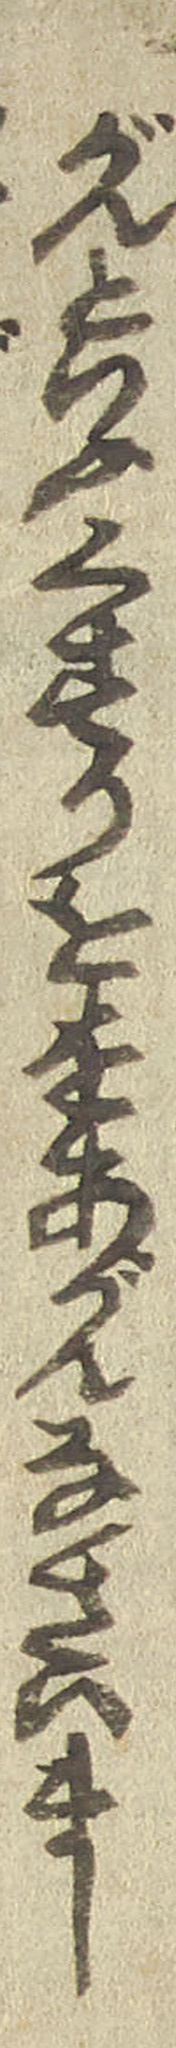がんといふくすりををあがんなさいまし
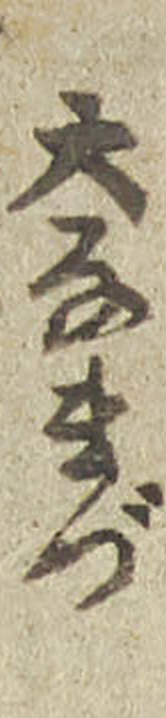大なまづ
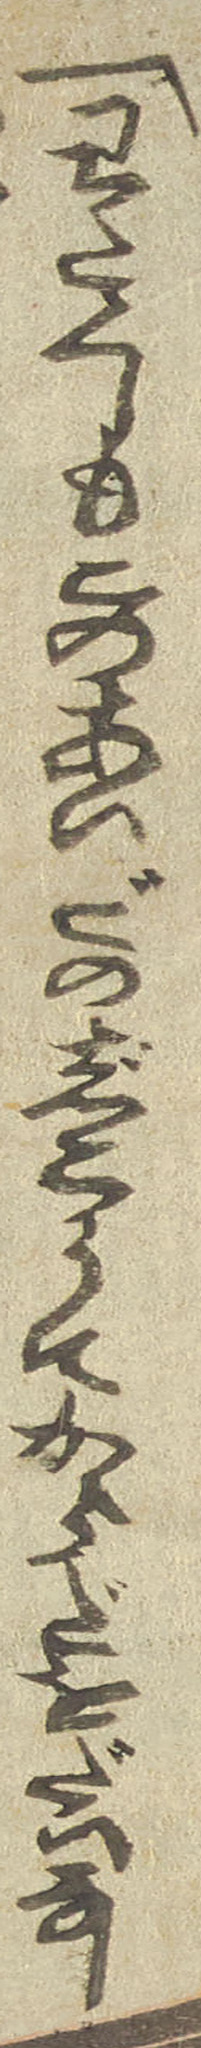「わたくしもこのあいだのじこうてからだをだいなし
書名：[病気鯰に諸職人見舞の図]
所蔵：東京大学総合図書館 General Library in the University of Tokyo, JAPAN
